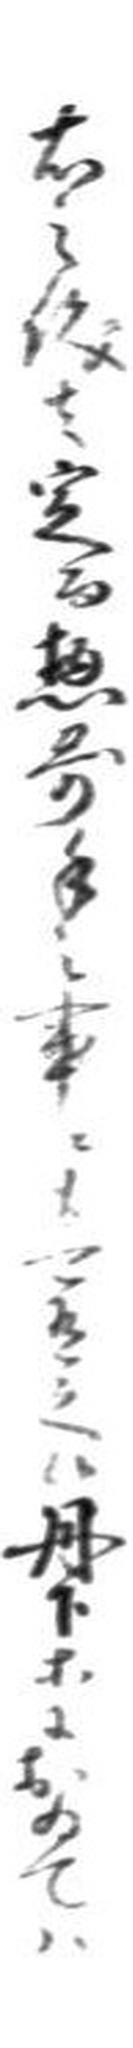右之儀者定而惣寄手之事ニも可有之候丹下等におゐてハ
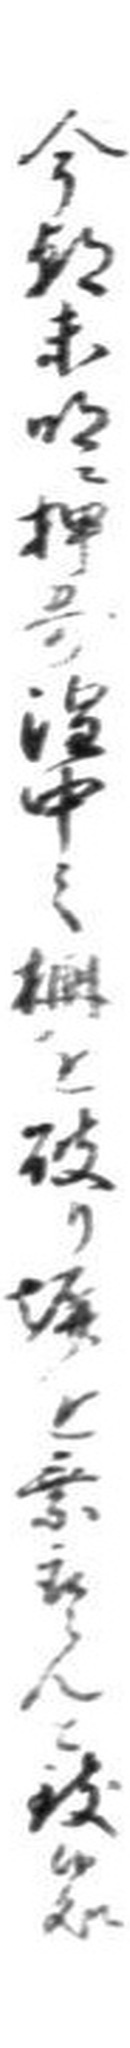今朝未明ニ押寄湟中之柵を破り塀を乗取らんと致候処
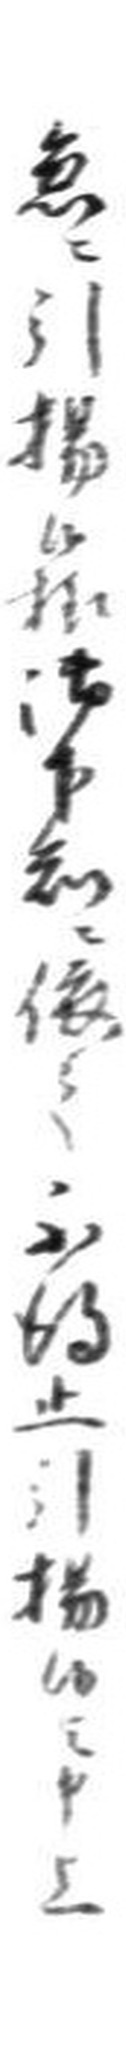急ニ引揚候様御下知ニ依て不得止引揚候与申上
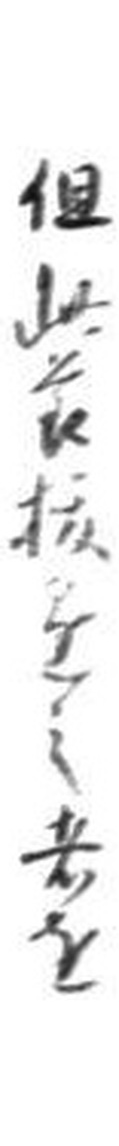但此節抜懸之者を
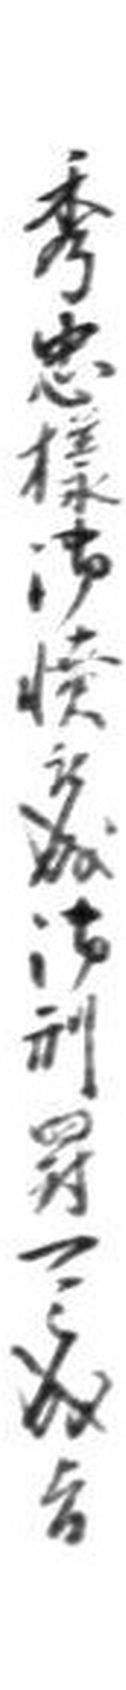秀忠様御憤被成御刑罸可被成旨

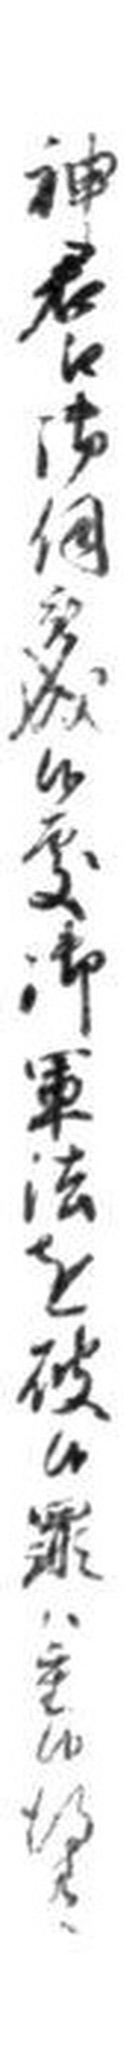神君江御伺被成候処御軍法を破候罪ハ重候得共
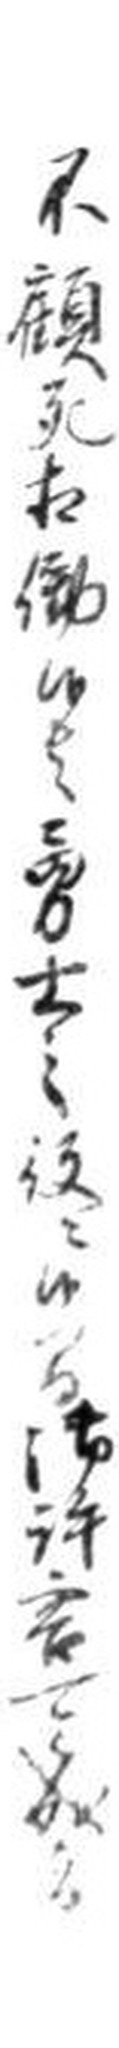不顧死相働候者勇士之役ニ候間御許容可被成旨
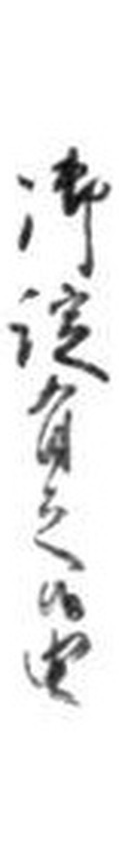御諚有之候由
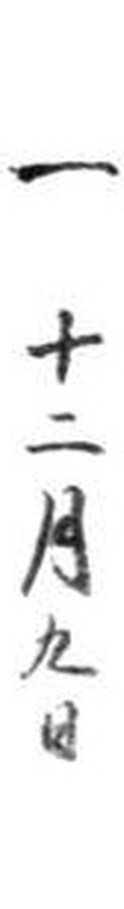一十二月九日
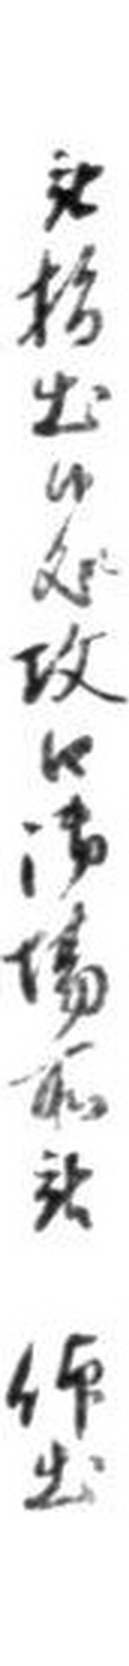被指出候処攻口御場所被仰出
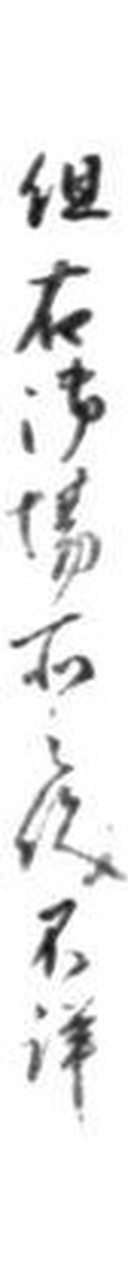但右御場所之儀不詳
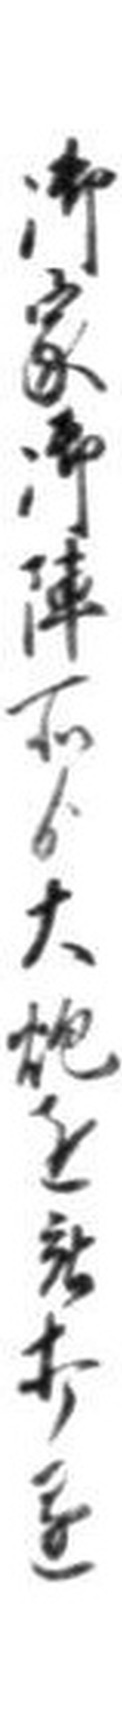御家御陣所ゟ大炮を被打懸
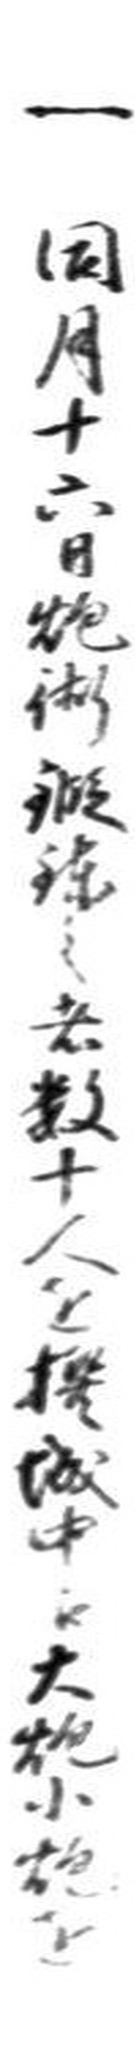一同月十六日炮術鍛錬之者数十人を撰城中江大炮小炮を
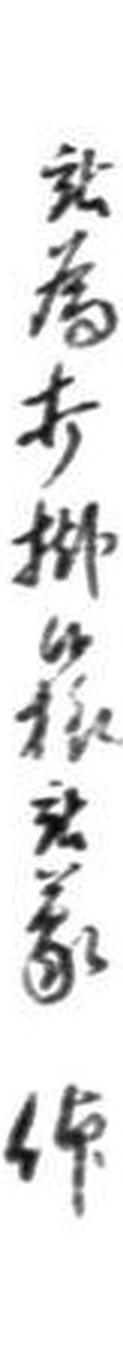被為打掛候様被蒙仰
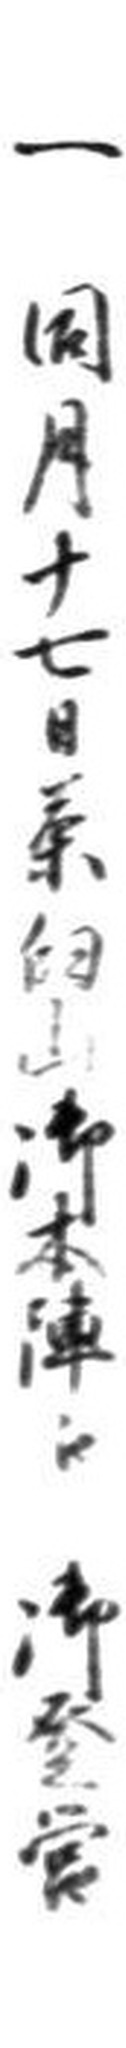一同月十七日茶臼山御本陣江御登営
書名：家譜 二 忠直公 従文禄四年到慶安四年
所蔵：福井県文書館 Fukui Prefectural Archives
